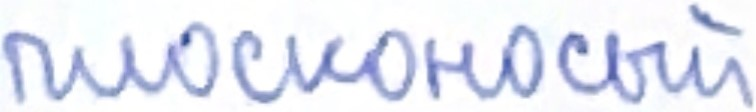плосконосый
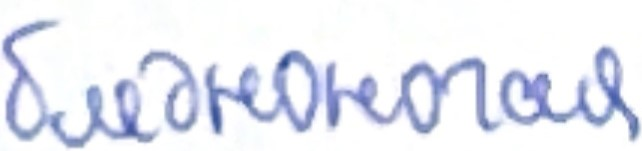бледноногая
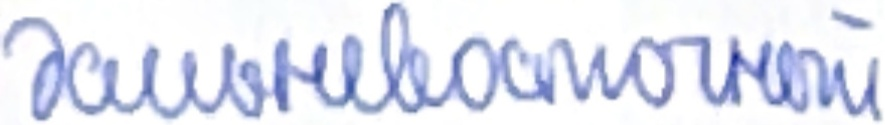дальневосточный
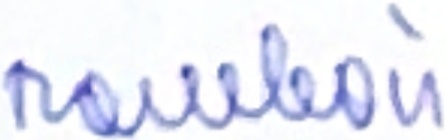полевой
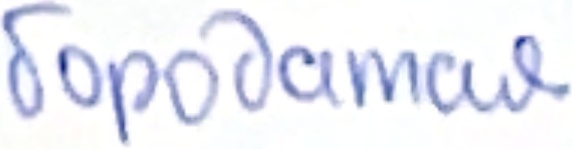бородатая
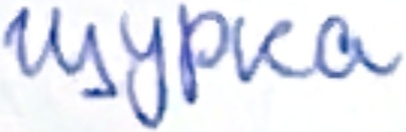щурка
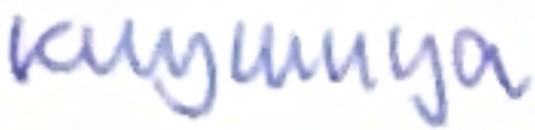клушица
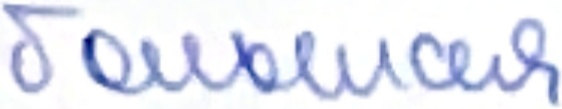большая
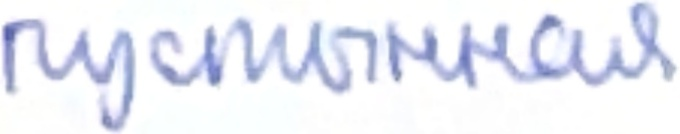пустынная
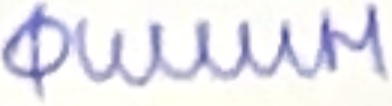филин
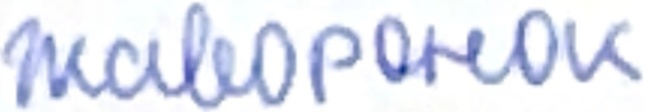жаворонок
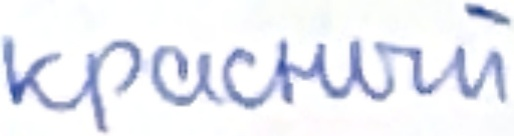красный
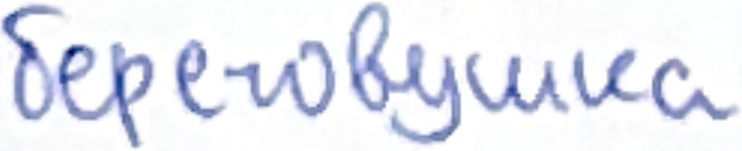береговушка
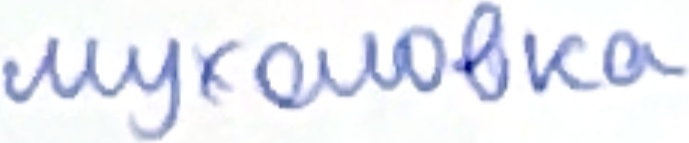мухоловка
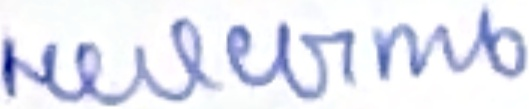неясыть
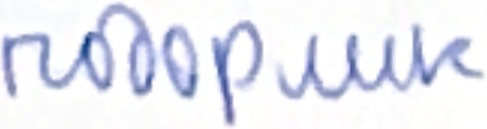подорлик
